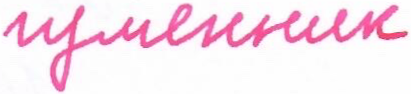гуменник
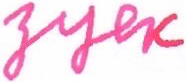зуек
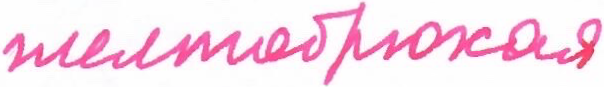желтобрюхая
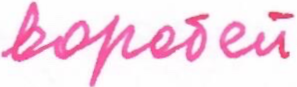воробей
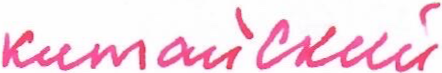китайский
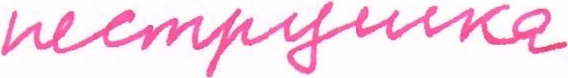пеструшка
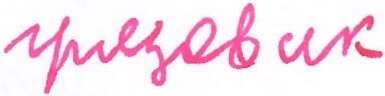грязовик
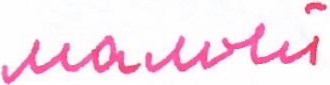малый
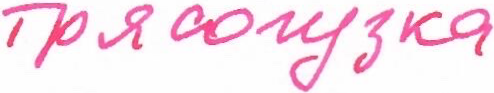трясогузка
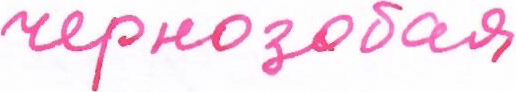чернозобая
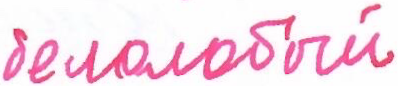белолобый
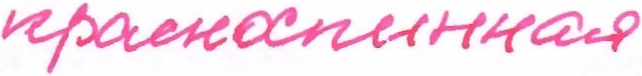красноспинная
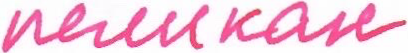пеликан
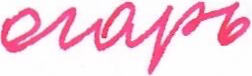огарь
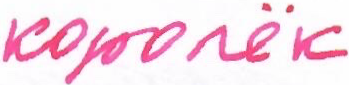королёк
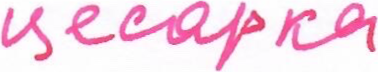цесарка
